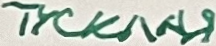тусклая
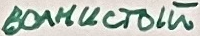волнистый
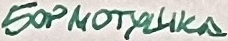бормотушка
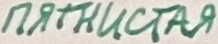пятнистая
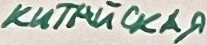китайская
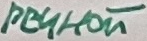речной
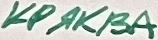кряква
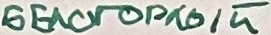белогорлый
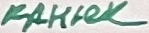канюк
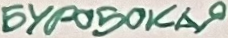буробокая
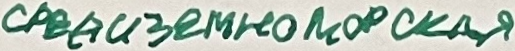средиземноморская
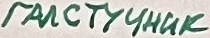галстучник
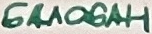балобан
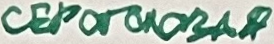сероголовая
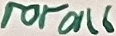гоголь
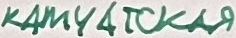камчатская
